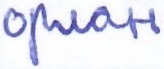орлан
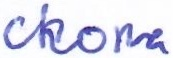скопа
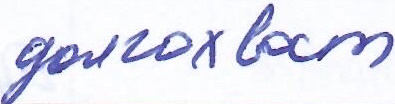долгохвост
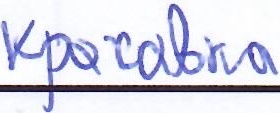красавка
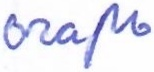огарь
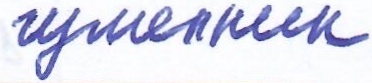гуменник
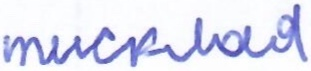тисклая
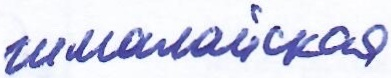гималайская
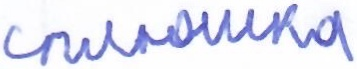сплюшка
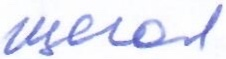щегол
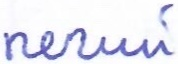пегий
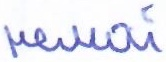немой
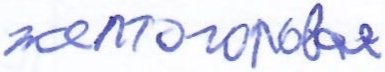желтоголовая
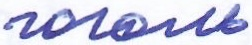гоголь
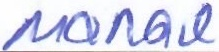малая
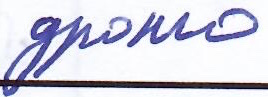дронго
